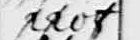2205
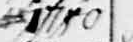1750
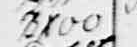3100
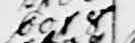6018
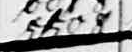5508
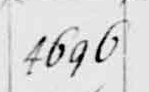4696
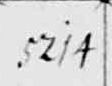5214
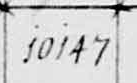10147
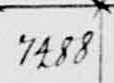7488
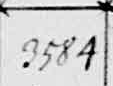3584
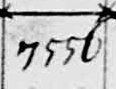7556
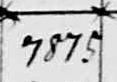7875
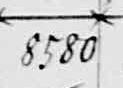8580
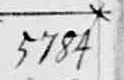5784
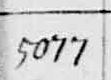5077
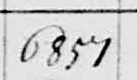6857
